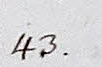43.
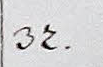32.
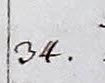34.
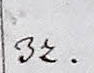32
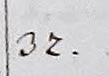32.
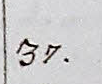37.
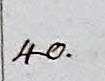40.
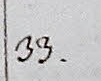33.
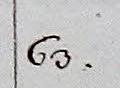63.
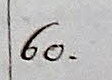60.
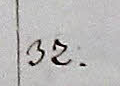32.
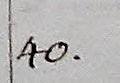40.
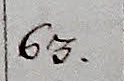63.
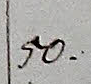50
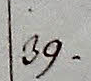39
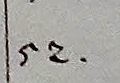52.
